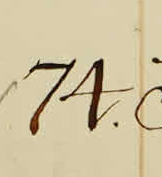74.
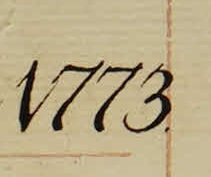1773.
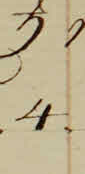4
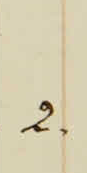2
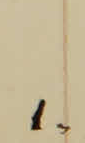1
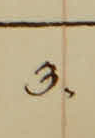3
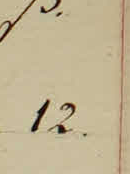12.
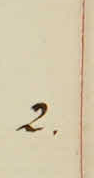2.
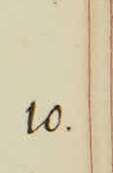10.
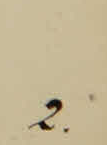2.
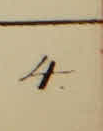4.
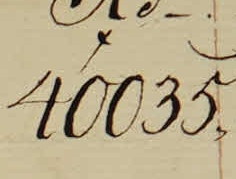40035
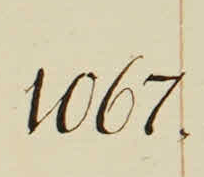1067
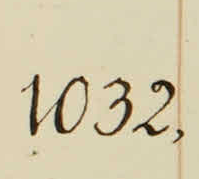1032
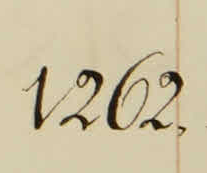1262
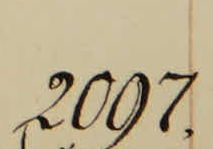2097
